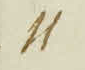11
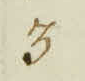3
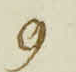9
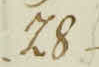28
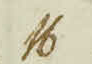16
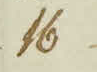16
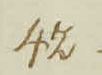42
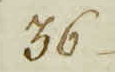36
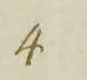4
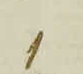1
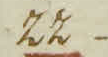22
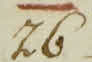26
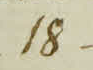18
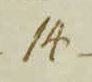14
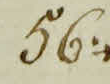56
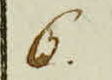6.
